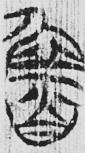魯
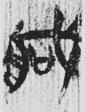○（莊）
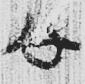公
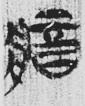𨟻（將）
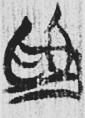爲
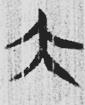大
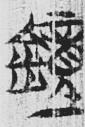鐘
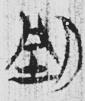型
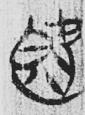既
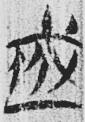城（成）
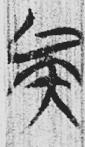矣
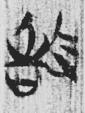○（曹）
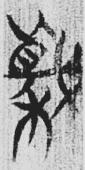○（沫）
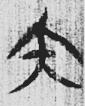内（入）
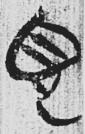見
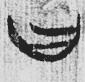曰
